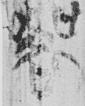○（恪）
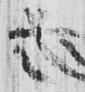必
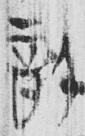信
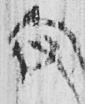府（俯）
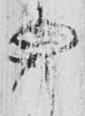視
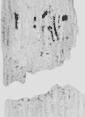地
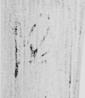利（理）
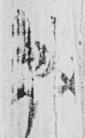敄（務）
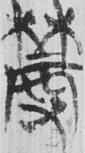○（辳）
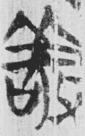敬
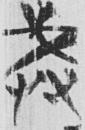戒
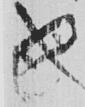母
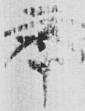不
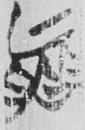能
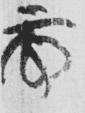而
